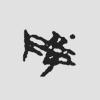降
